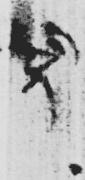兌（悅）
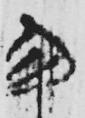勿（物）
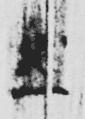之
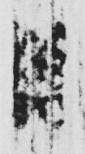埶（勢）
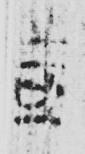者
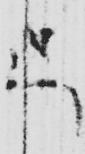之
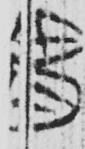胃（謂）
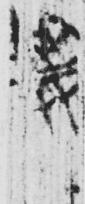埶（勢）
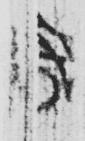有
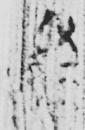爲
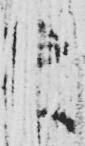也
